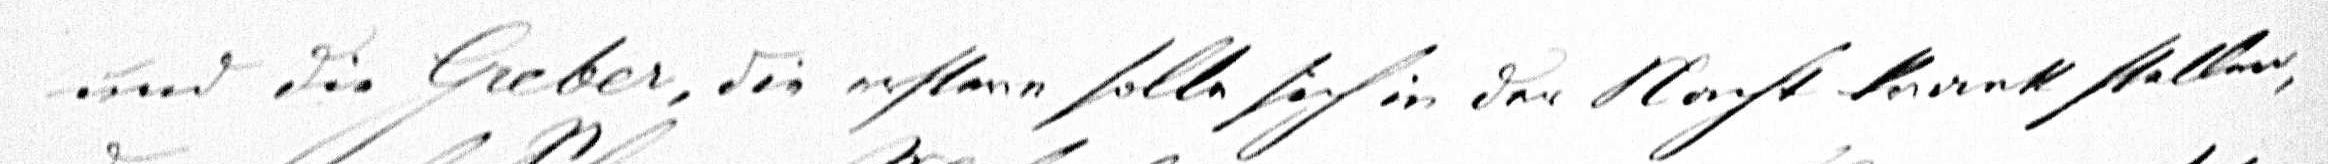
und die Greber, die erstere sollte sich in er Nacht krank stellen,
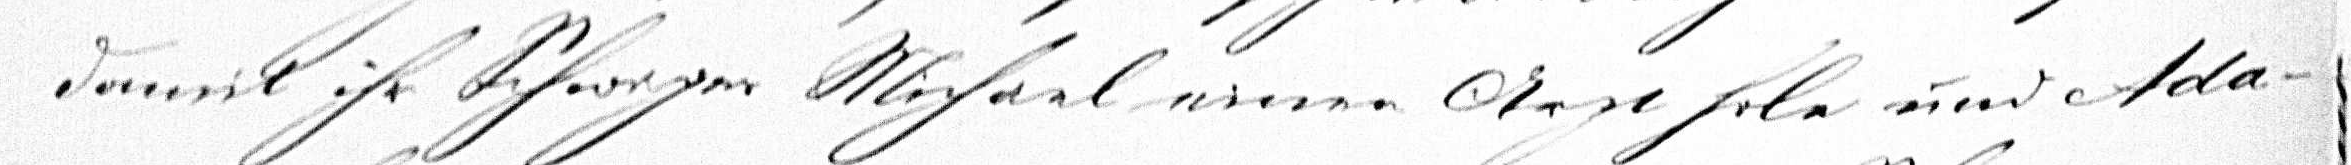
damit ihr Schwager Michael einen Arzt hole und Ada¬
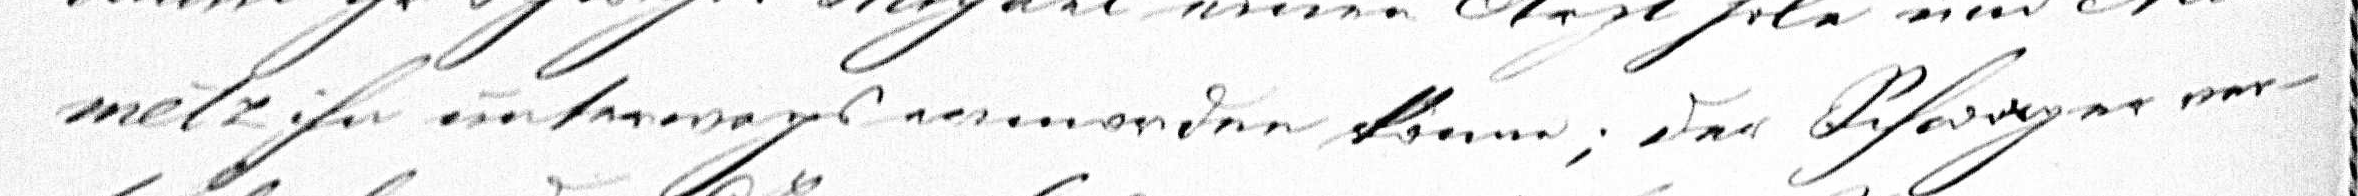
metz ihn unterwegs ermorden könne; der Schwager ver¬
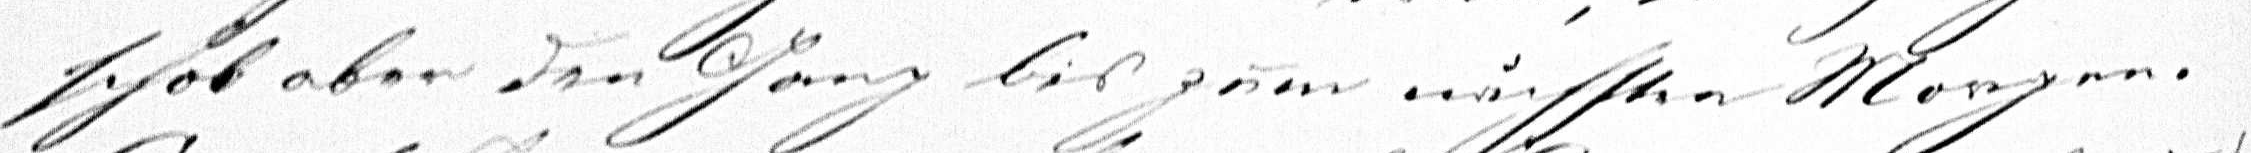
schob aber den Gang bis zum nächsten Morgen.
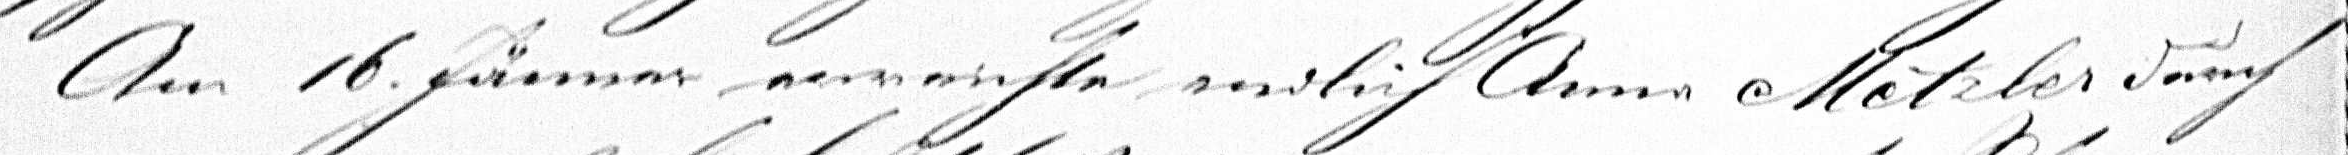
Am 16. Jänner erreichte endlich Anna Metzler durch
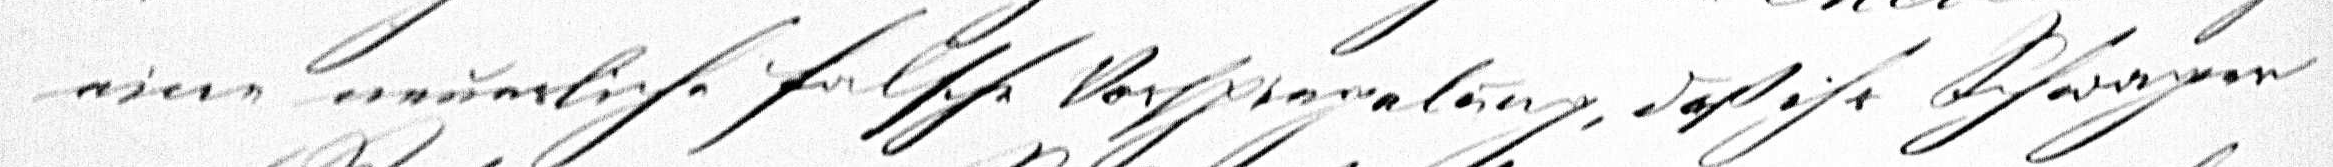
eine neuerliche falsche Vorspiegelung, daß ihr Schwager
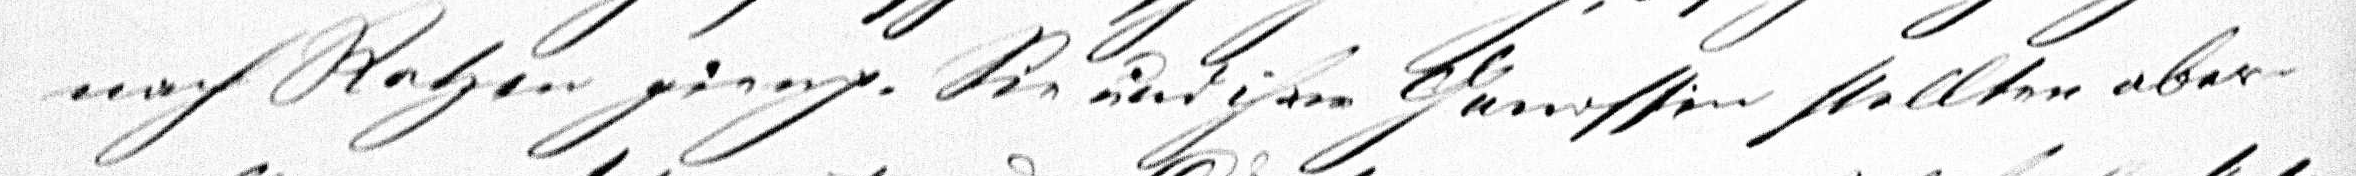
nach Ratzen gieng. Sie und ihre Genossin stellten aber¬
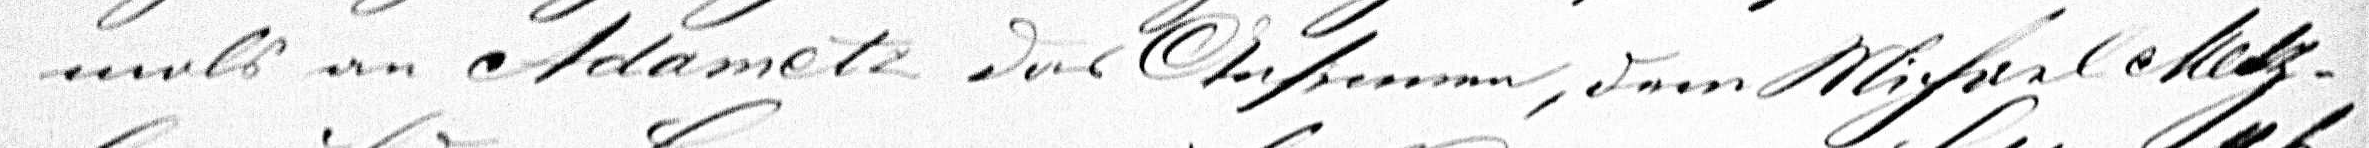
mals an Adametz das Ansinnen, dem Michael Metzler
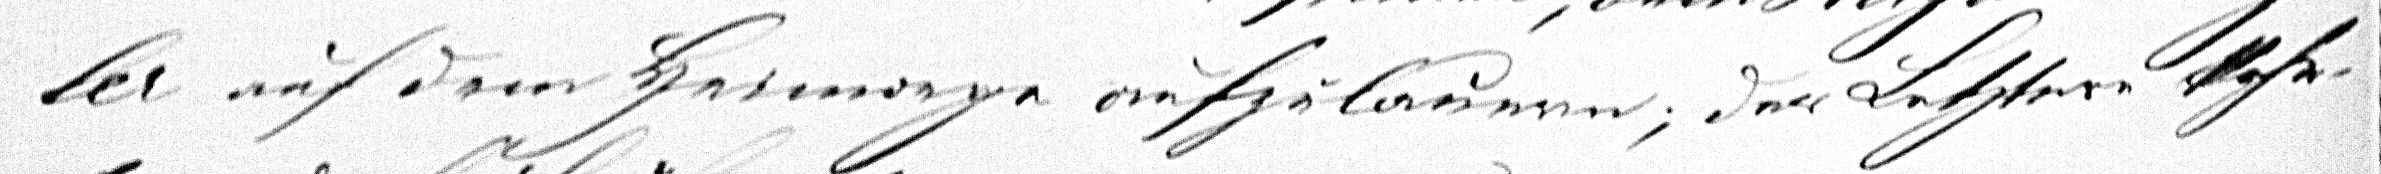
auf dem Heimwege aufzulauern; der Letztere kehrte
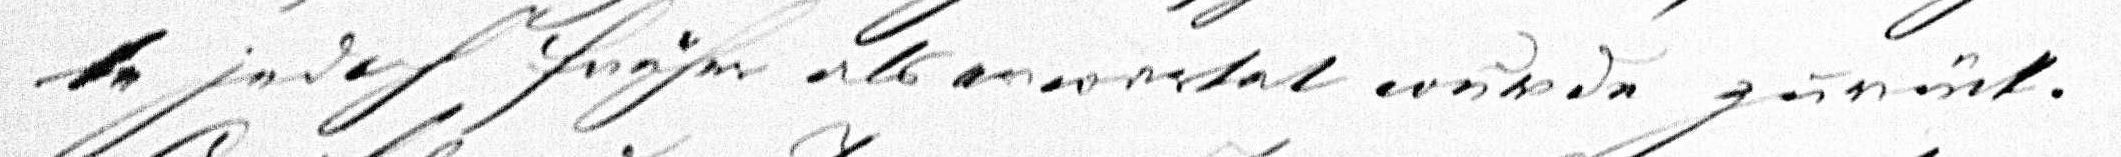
jedoch früher als erwartet wurde zurück.
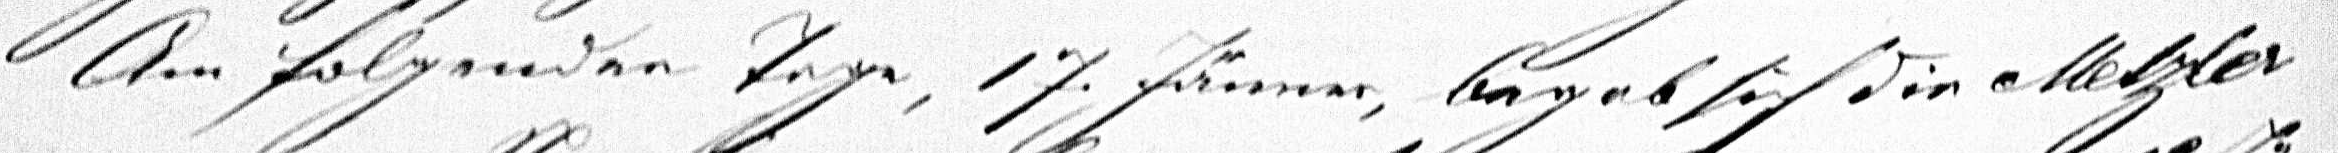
Am folgenden Tage, 17. Jänner, begab sich die Metzler
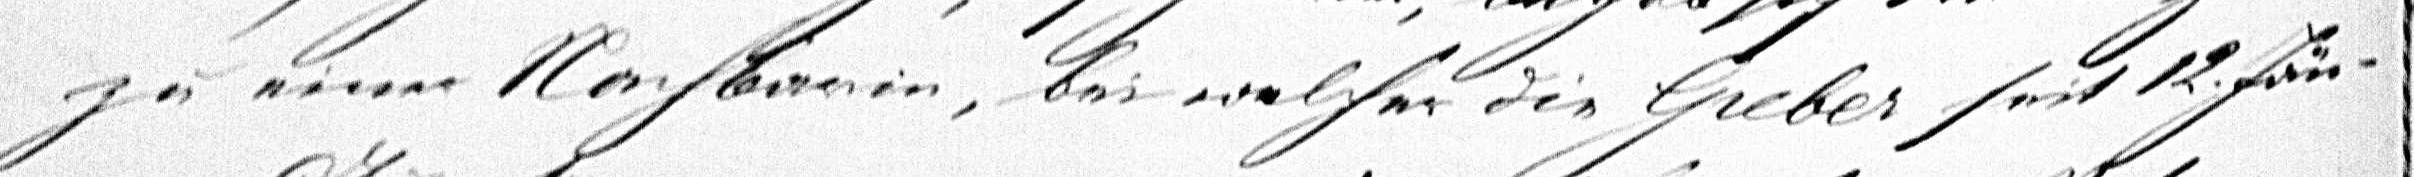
zu einer Nachbarin, bei welcher die Greber seit 12. Jän¬
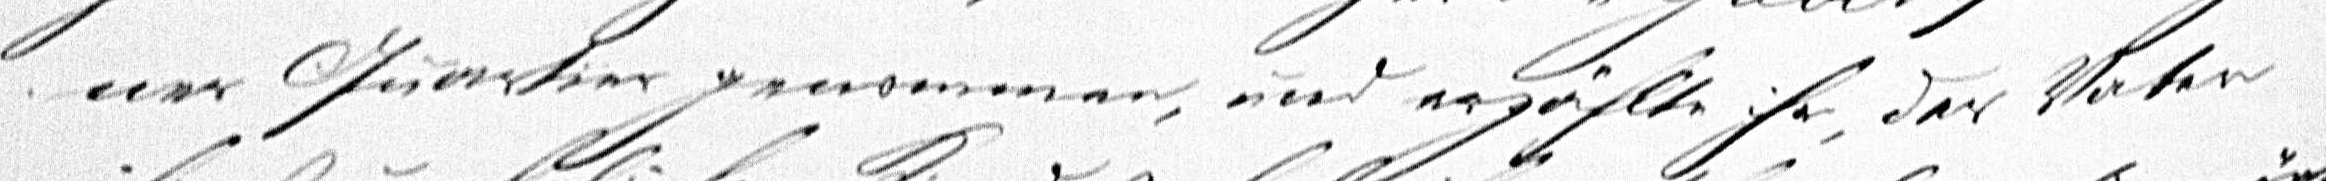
ner Quartier genommen, und erzählte ihr, der Vater
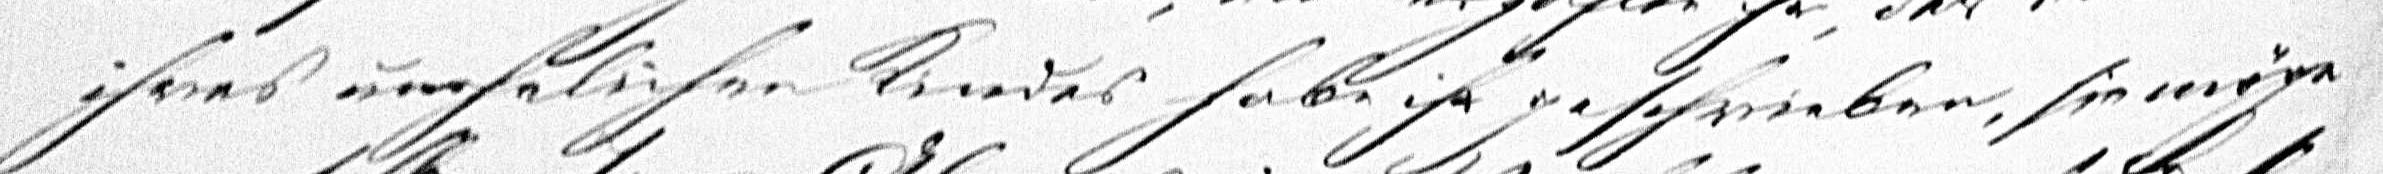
ihres unehelichen Kindes habe ihr geschrieben, sie möge
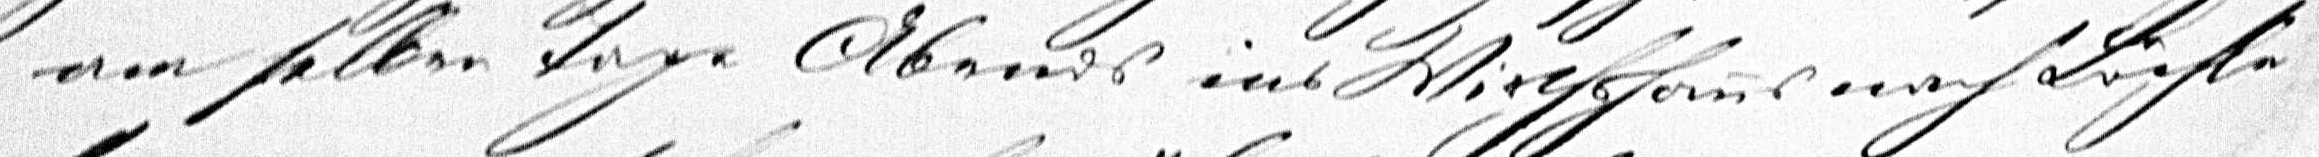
am selben Tage Abends ins Wirtshaus nach Löchte
